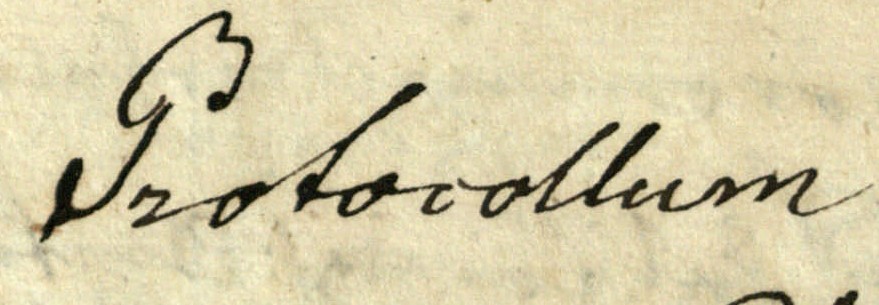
Protocollum
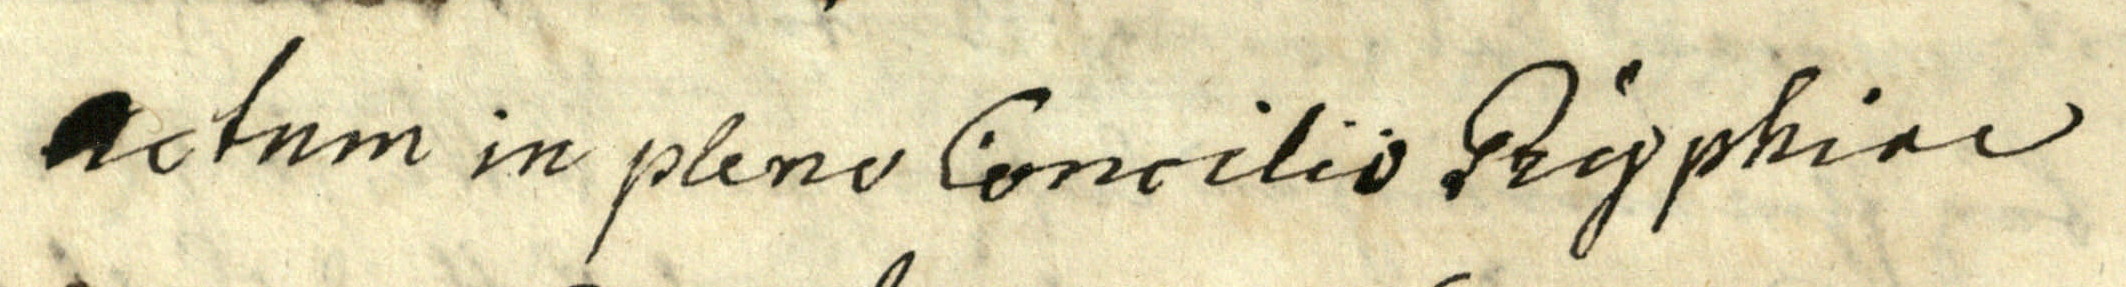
Actum in pleno Concilio Grÿphiae
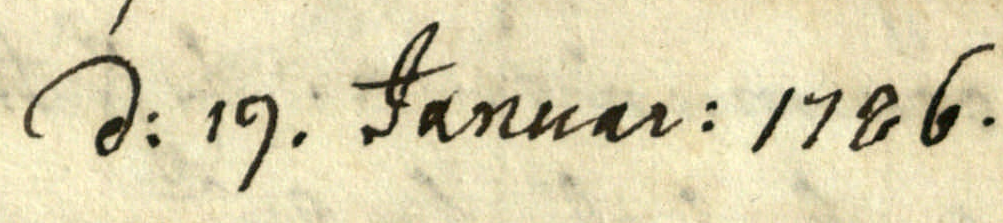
d. 19. Januar 1786.
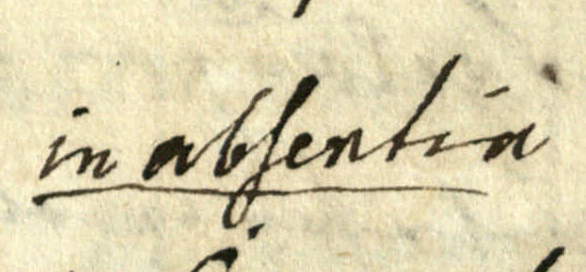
in absentia
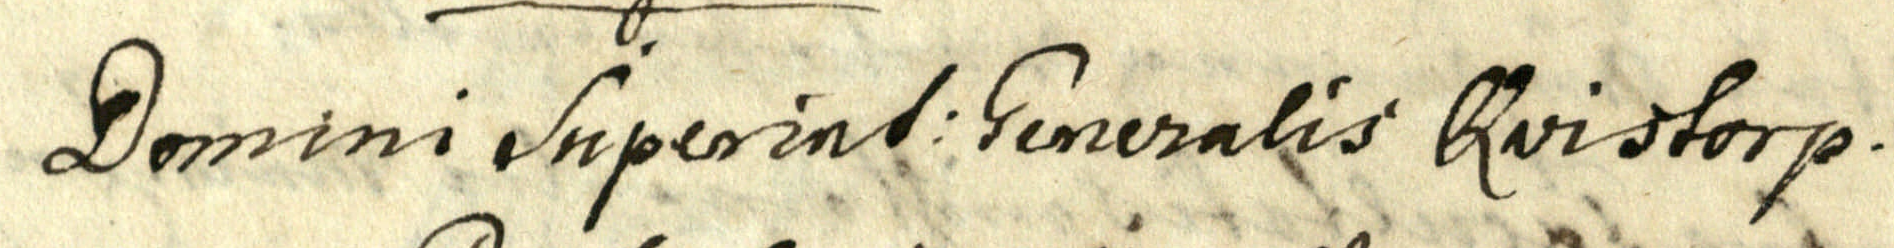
Domini Superint Generalis Quistorp.
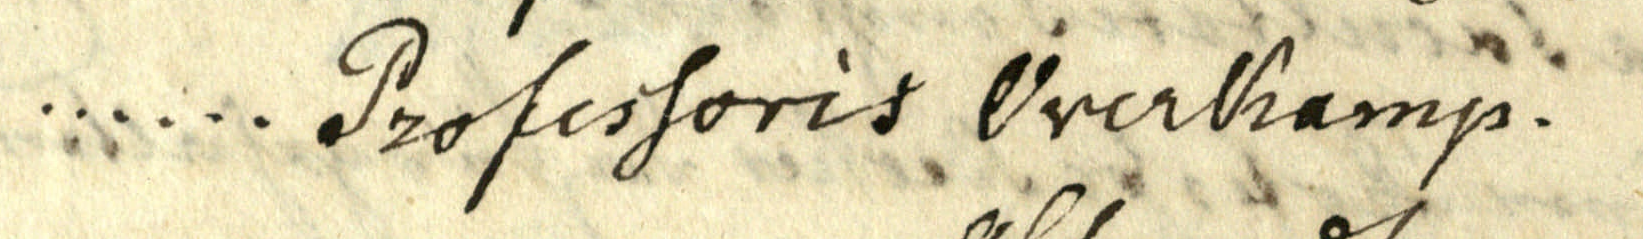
Professoris Overkamp.
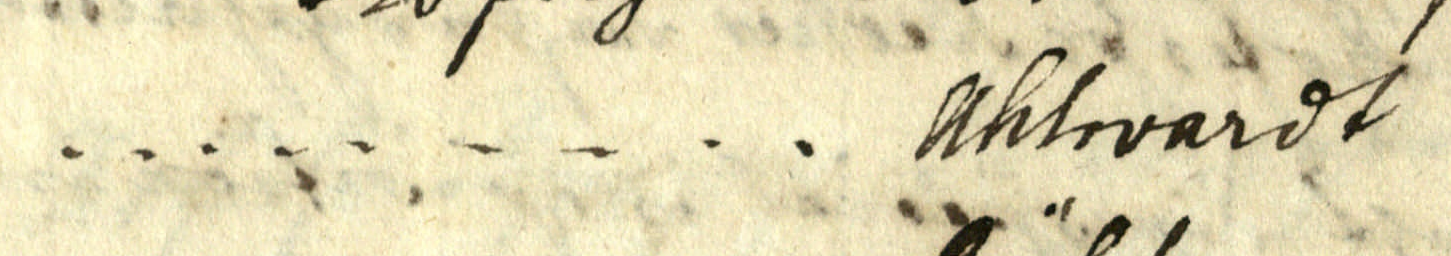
Ahlwardt
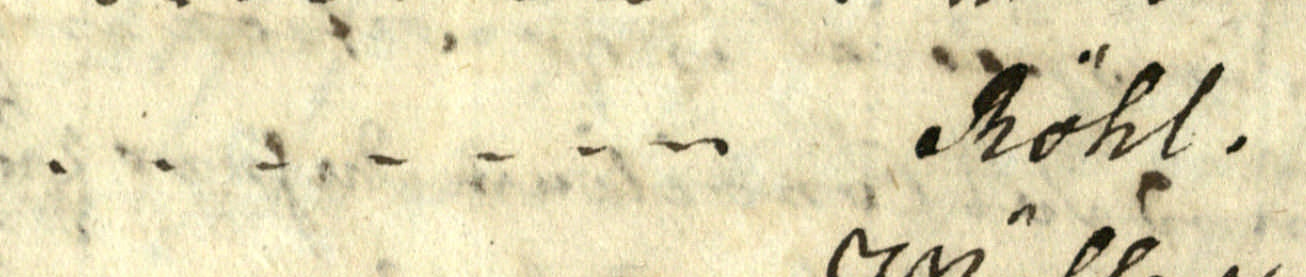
Röhl.
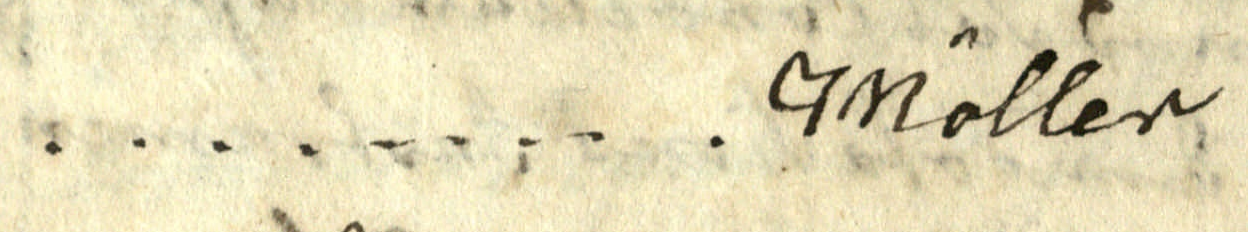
Möller
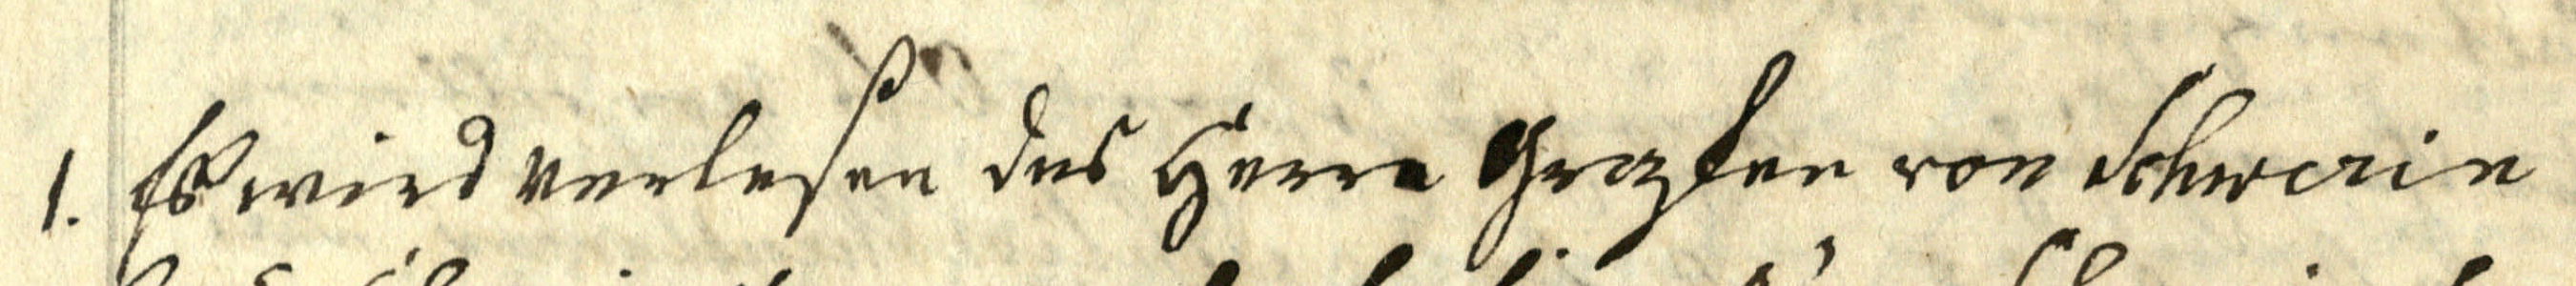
1. Es wird verlesen des Herrn Grafen von Schwerin
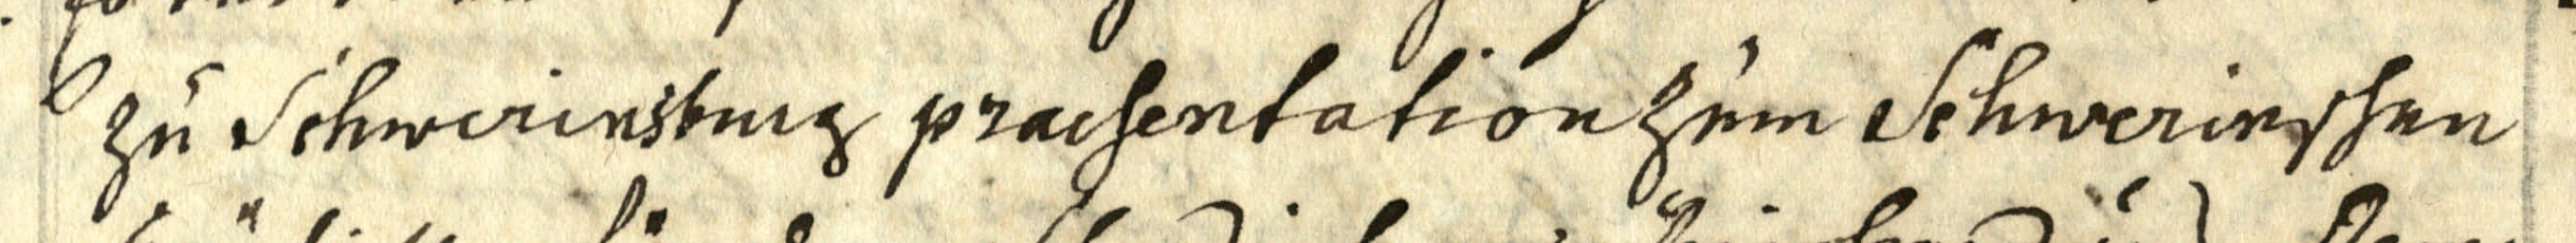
zu Schwerinsburg praesentation zum Schwerinschen
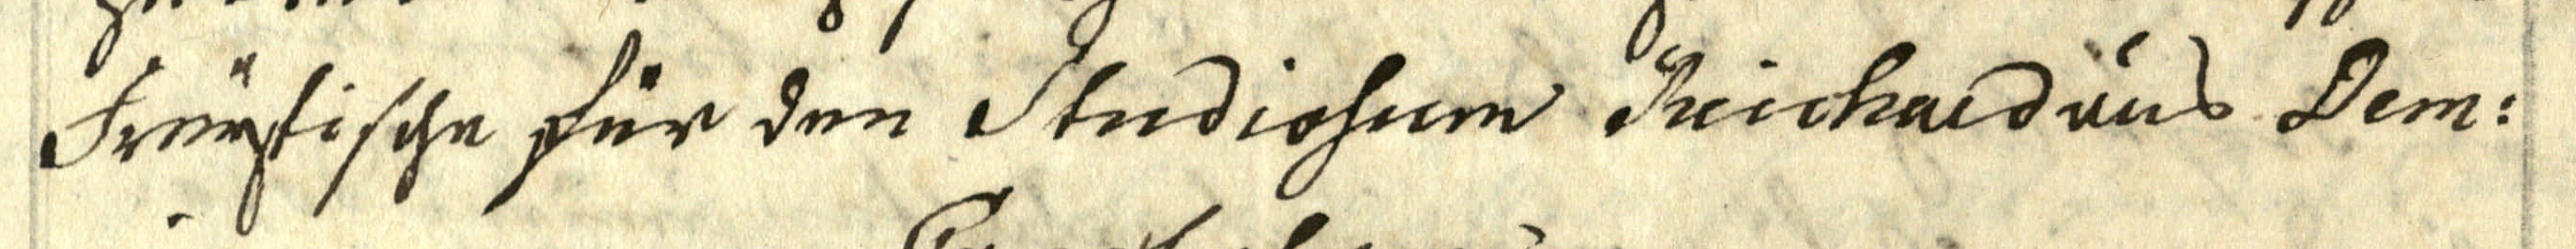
Freÿtische für den Studiosum Reichard aus Dem¬
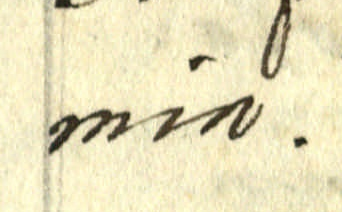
min.
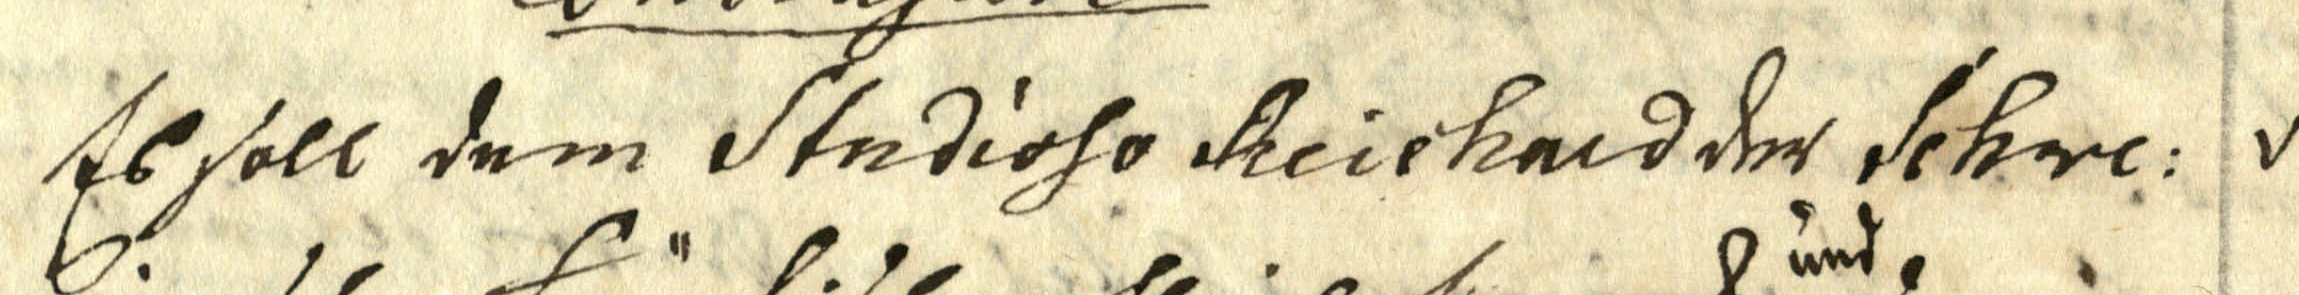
Es soll dem Studioso Reichard der Schwe¬
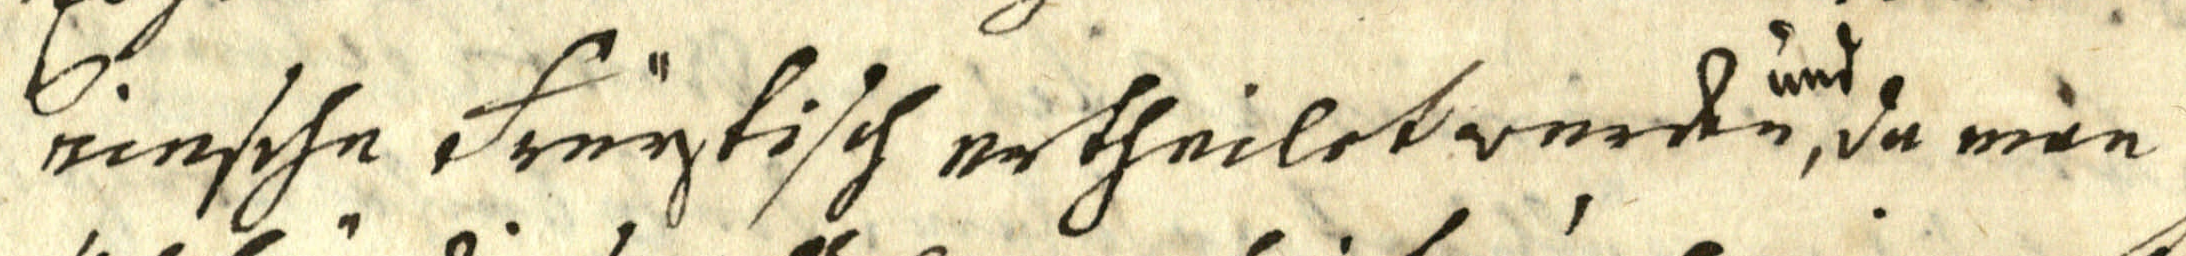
rinsche Freÿtisch ertheilet werden, und da man
